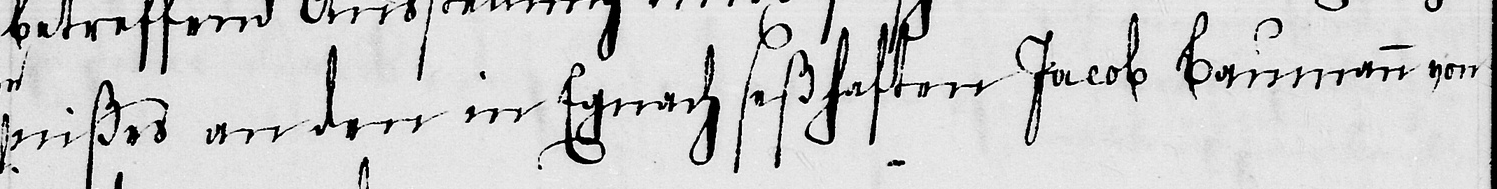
nißes an den in Egnach seßhaften Jacob Baumann von
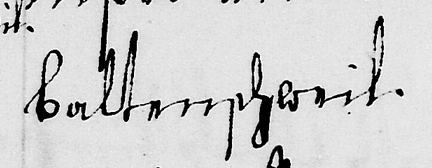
Baltenschweil.
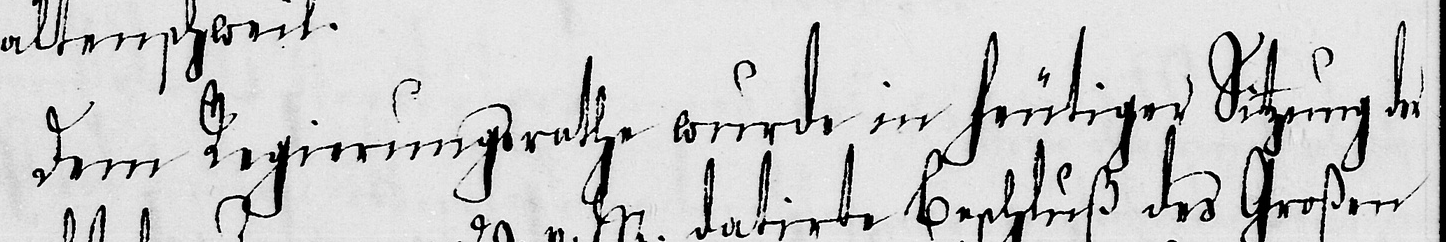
Dem Regierungsrathe wurde in heutiger Sitzung d¬
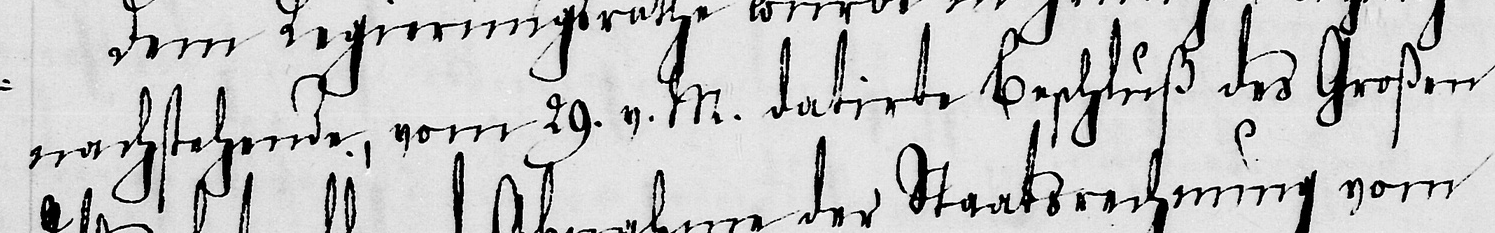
nachstehende, vom 29. v. M. datirte Beschluß des Großen
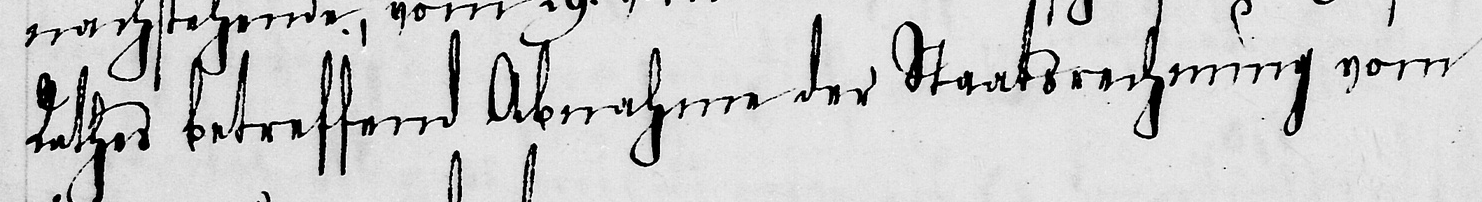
Rathes betreffend Abnahme der Staatsrechnung vom
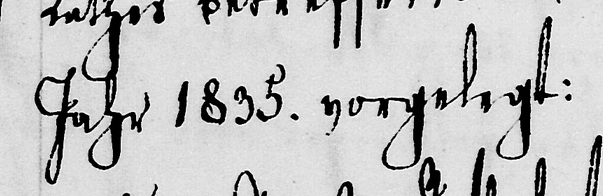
Jahr 1835. vorgelegt:
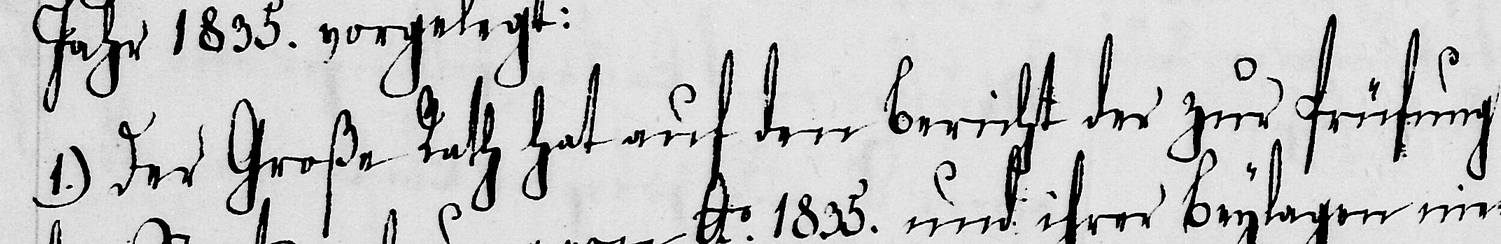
1). Der Große Rath hat auf den Bericht der zur Prüfung
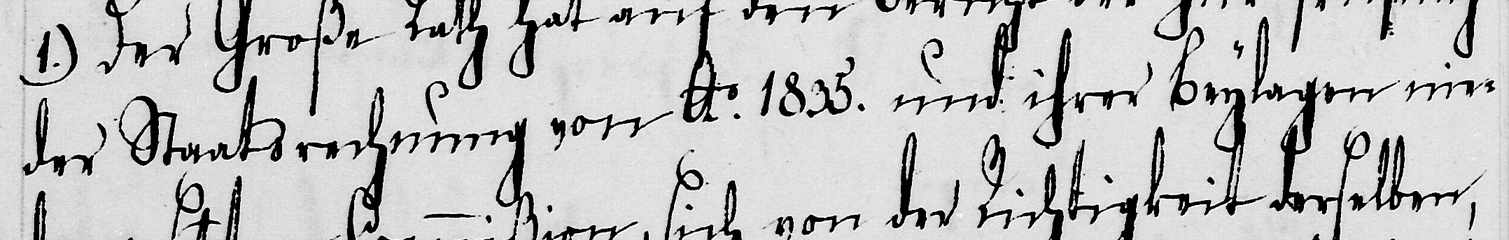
der Staatsrechnung von A°. 1835. und ihrer Beylagen nie¬
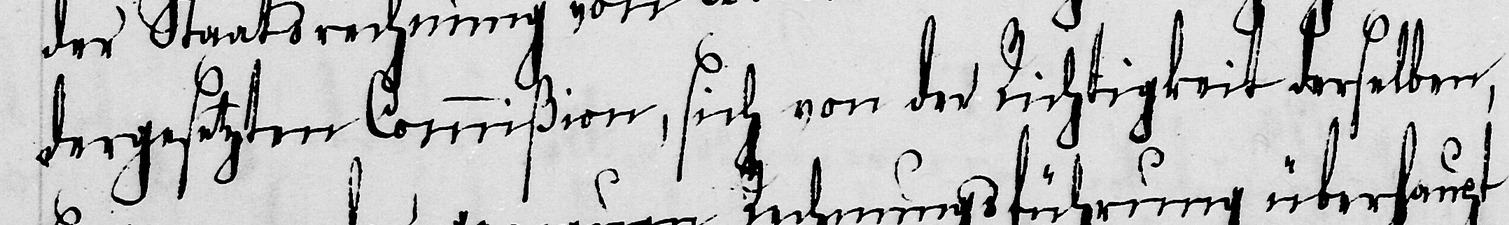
dergesetzten Commißion, sich von der Richtigkeit derselben,
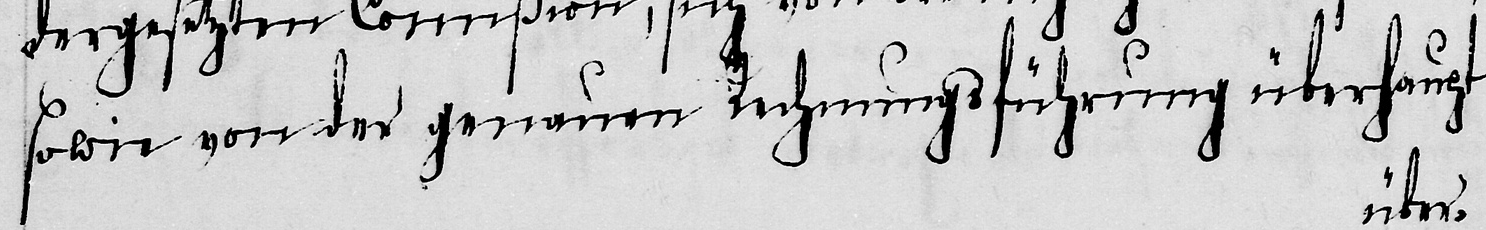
sowie von der genauen Rechnungsführung überhaupt
